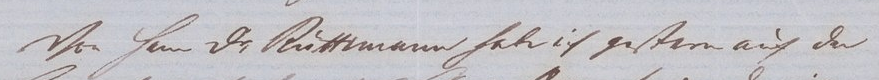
Von Herrn DrRüttimann habe ich gestern auf der
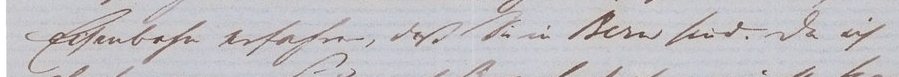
Eisenbahn erfahren, daß Sie in Bern sind. Da ich
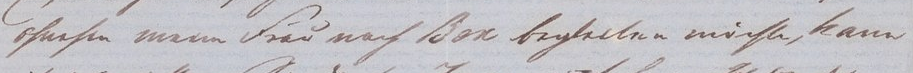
ohnehin meine Frau nach Bex begleiten möchte, kann
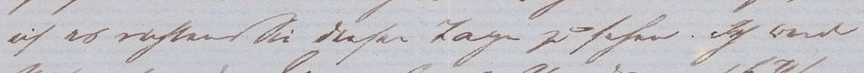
ich es richten Sie diese Tage zu sehen. Ich werde
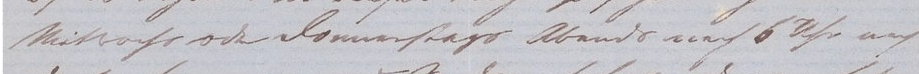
Mitwochs oder Donnerstags Abends nach 6 Uhr nach
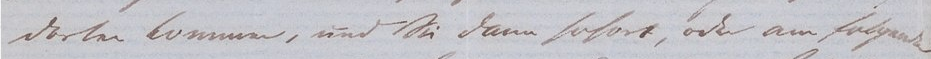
dorten kommen, und Sie dann sofort, oder am folgenden
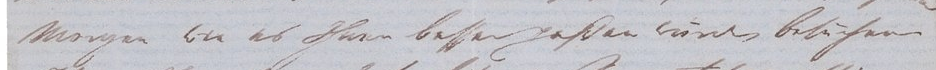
Morgen wie es Ihnen besser paßen würde besuchen.
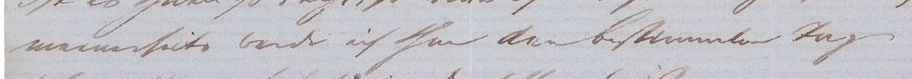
meinerseits werde ich Ihnen den bestimmten Tag
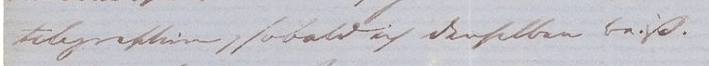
telegraphiren, sobald ich denselben weiß.
